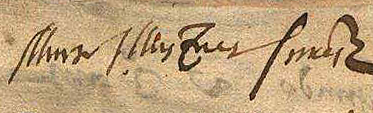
Muito Jllustres Snres̄
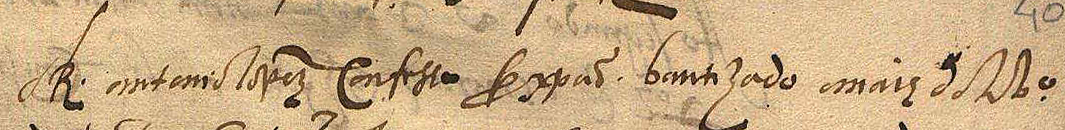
O R. antonio lopez Confessa ꞩ xpaõ bautizado o mais do lib.o
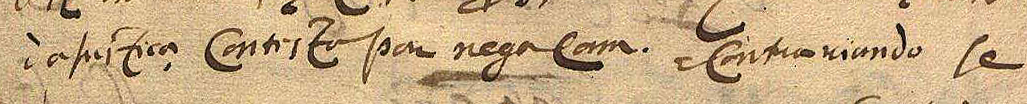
da Justiça Contesta por negaçam. E Contrariando se
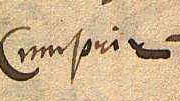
Cumprir
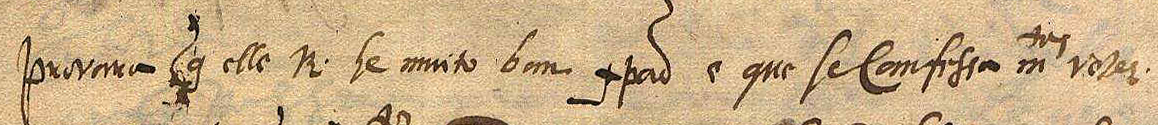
Provara q̄ elle R. he muito bom xpão e que se Comfessa mtas vezes
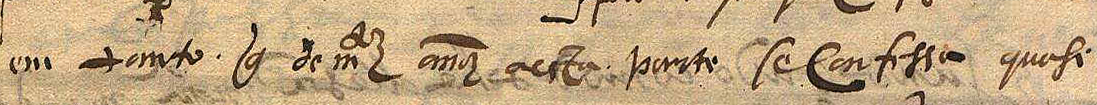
em tamto q̄ de mtos anos a esta parte se Confessa quasi
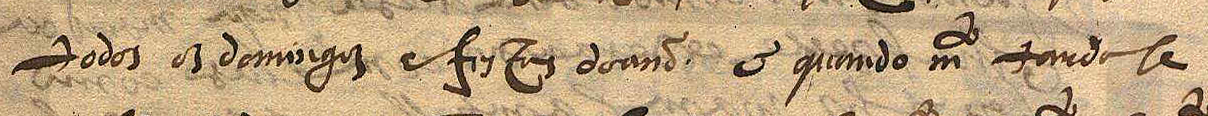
todos os domingos e festas do ano. & quando mto tarda se
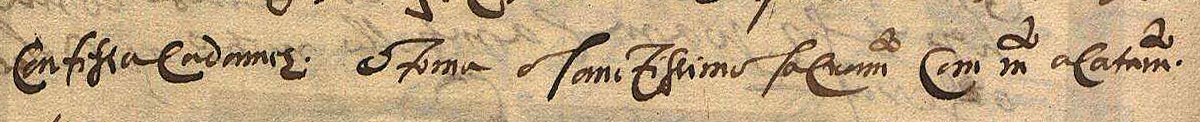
Confessa Cada mez: & toma o sanctissimo saCramto Com mto aCatamto.
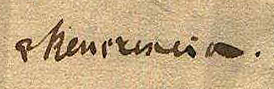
e Reuerencia.
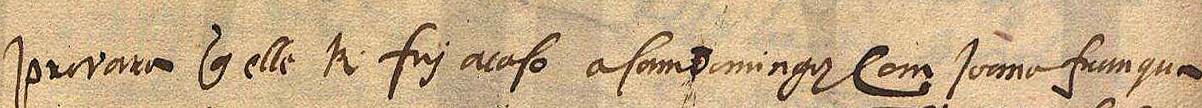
Provara q̄ elle R foy acaso a sam Domingos Com Joana franqua
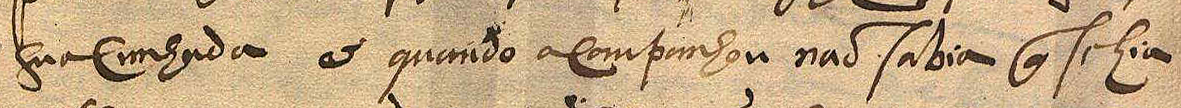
sua Cunhada & quando aCompanhou naõ sabia q̄ se hia
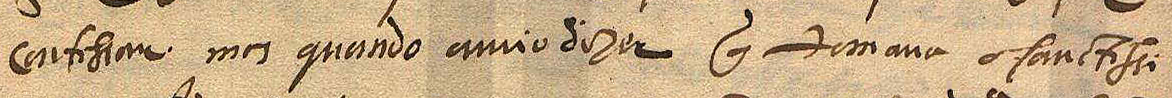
confessar mas quando ouuio dizer q̄ tomaua o sanctissi
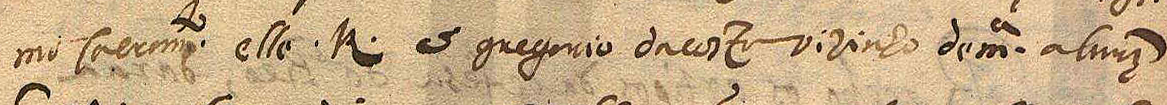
mo sacram.to elle .R. & gregorio da costa vizinho de ma. alur̄z
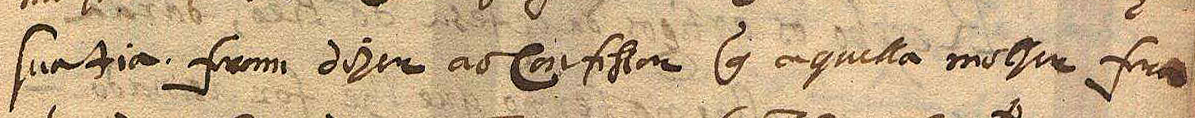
sua tia foram dizer ao Confessor q̄ aquella molher fora
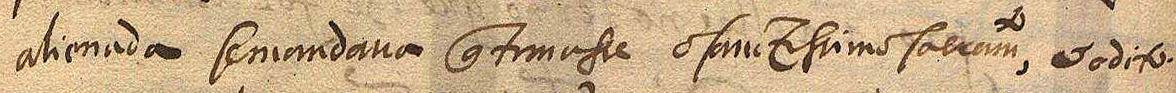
alienada se mandaua q̄ tomasse o sanctissimo sacramto, & o dito
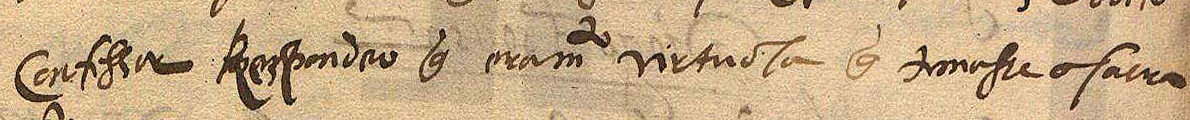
Confessor Respondeo q̄ era mto virtuosa q̄ tomasse o sacra
